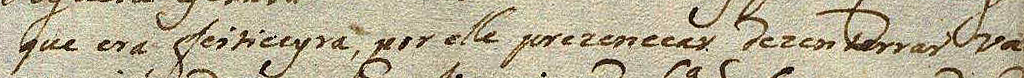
que era feiticeyra, por elle prezencear dezenterrar va
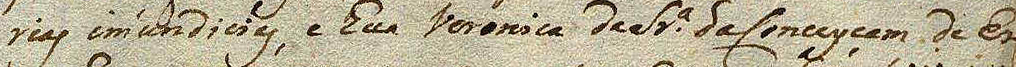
rias imundicias, e hua Veronica da Sr.a da Conceyçam de Es
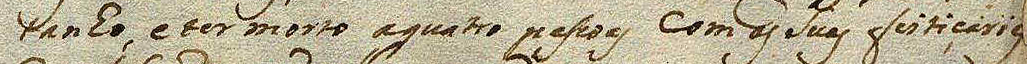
tanho, e ter morto a quatro pessoas com as suas feiticarias
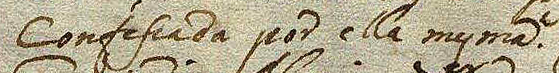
Confessada por ella mesma.
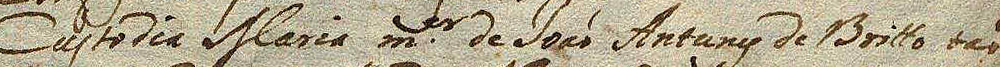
Custodia Maria m.er de Ioaõ Antunes de Britto taõ
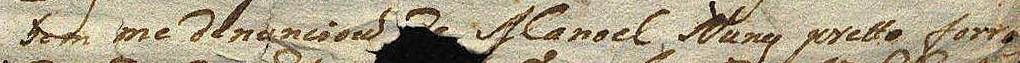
bem me denunciou de Manoel Nunes pretto forro
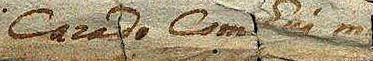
cazado com hua m
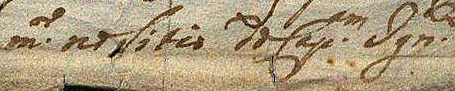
m.or no Sitio do Cap.am Ign.co
